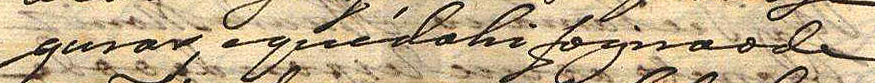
gurar, e que dahi fogira o de
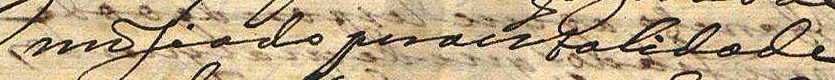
nūsiado pera esta Cidade
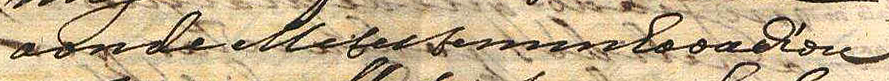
aonde elle testemunha o achou
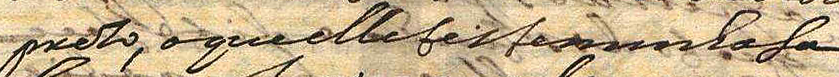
prezo, o que elle testemunha sa
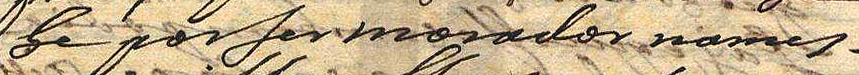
be por ser morador na mes
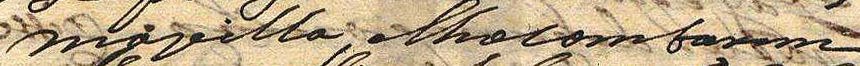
ma villa, e lho comtarem
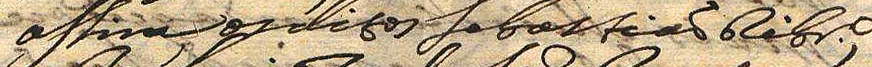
assim os ditos sebastiaõ Ribr.o,
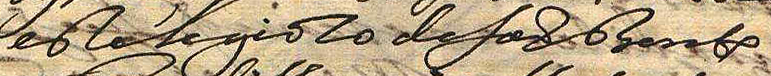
e Religiozo de saõ Bento.
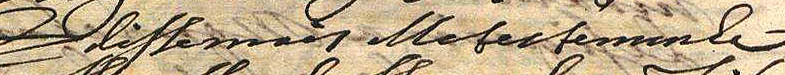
E disse mais elle testemunha
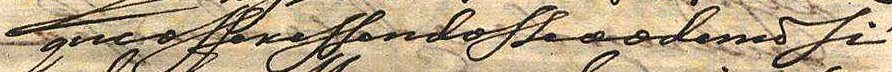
que offeressendosse ao denūsi
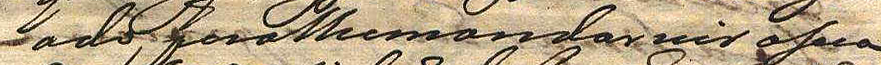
ado, pera lhe mandar uir a sua
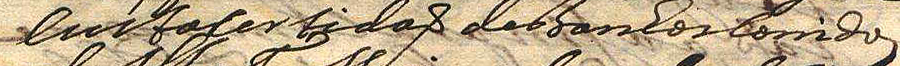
custa certidaõ dos banhos corridos
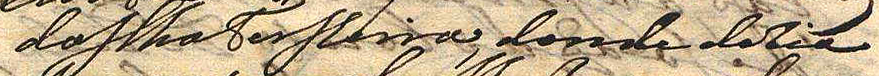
da Jlha Tersseira, donde dizia
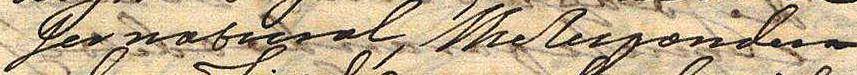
ser natural, lhe Respondera
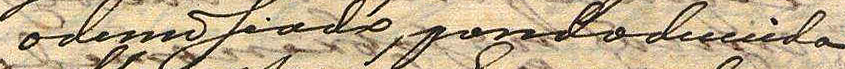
o denūsiado, pondo duuida
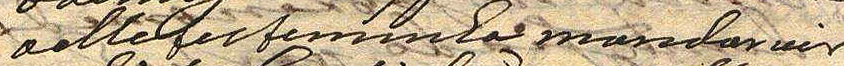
a elle testemunha mandar uir
